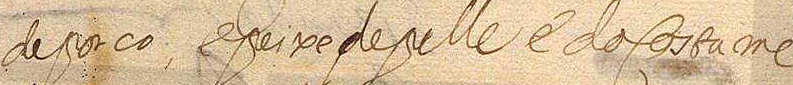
de porco, e peixe de pelle e do Costume
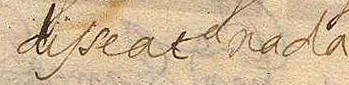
disse a ta nada
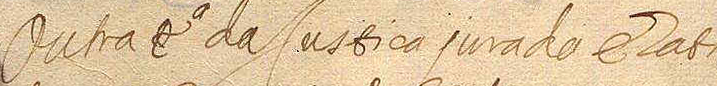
Outra ta da Justica jurada e Rati
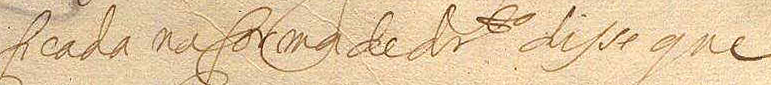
ficada na forma de drto disse que
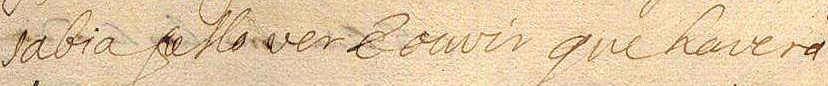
sabia pello ver e ouvir que haverà
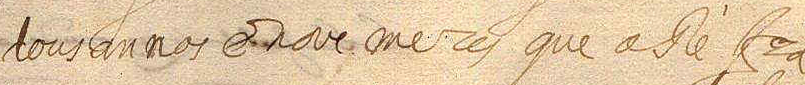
dous annos e nove mezes que a Rè Jza
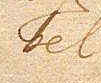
bel
